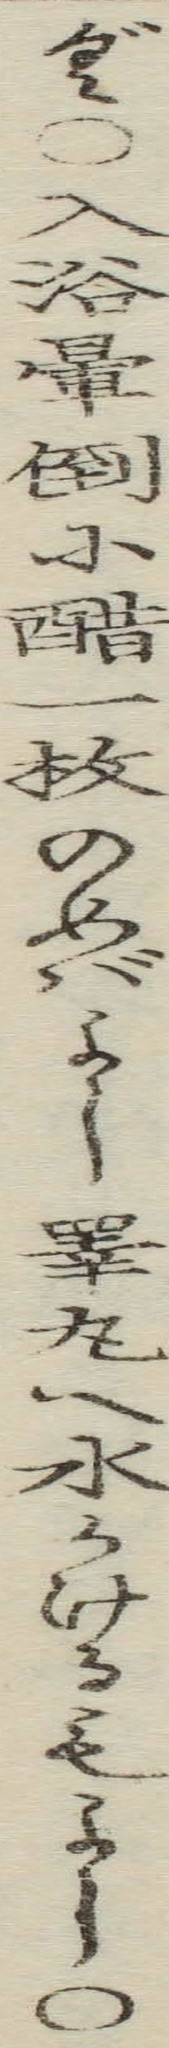ぐ○入浴暈倒に醋一枚のめばよし睾丸へ水かけるもよし○
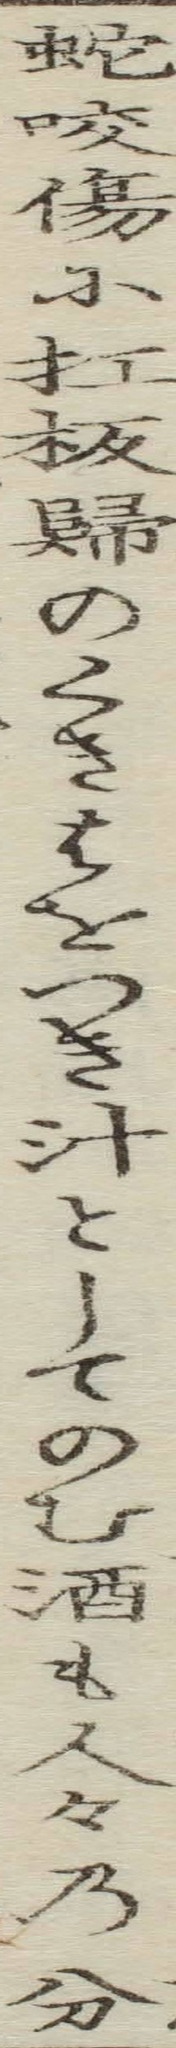蛇咬傷に杠板帰のくきはをつき汁としてのむ酒も人々の分
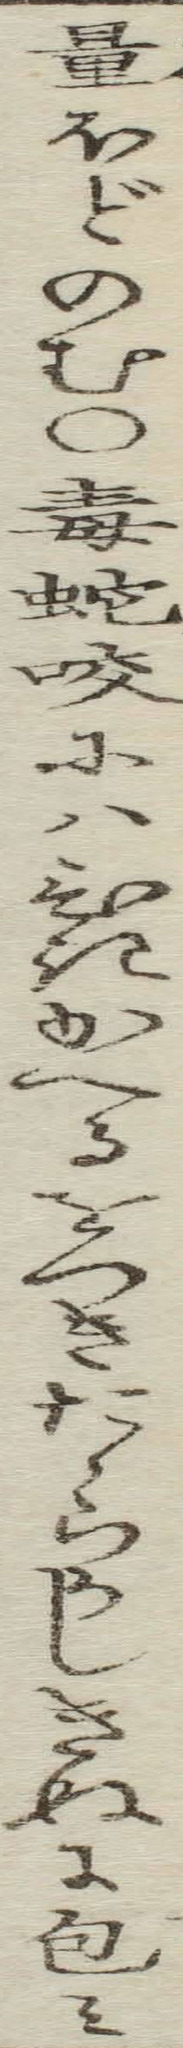量ほどのむ○毒蛇咬にはひきかへるをつきたゝらかしきぬに包み
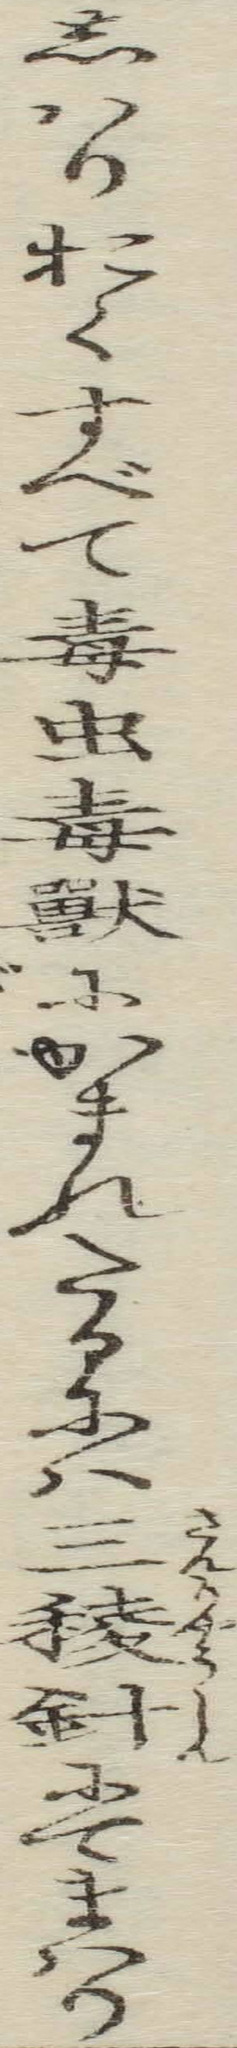しはりおくすべて毒虫毒獣にかまれたるには三稜針にてまはり
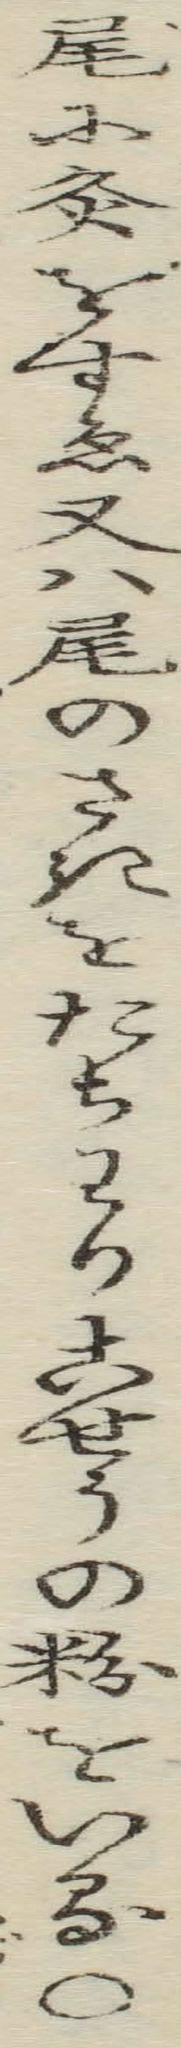尾に灸をすゑ又は尾のさきをたちわりこせうの粉をいる○
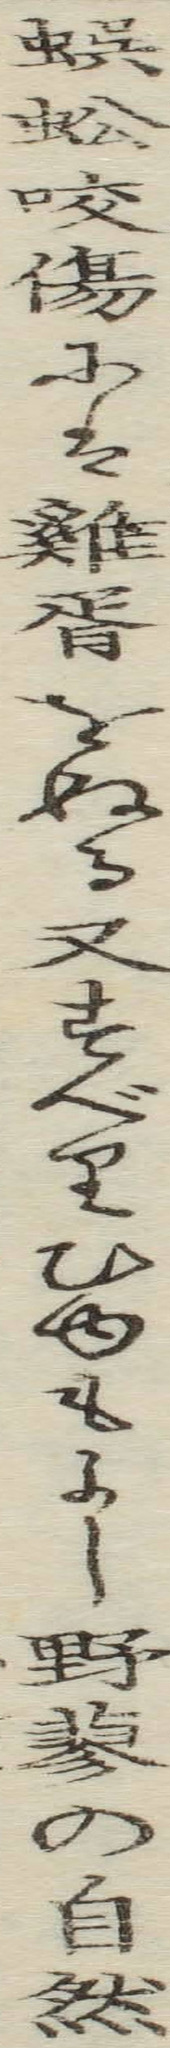蜈蚣咬傷には鶏胥をぬる又すべりひゆもよし野蓼の自然
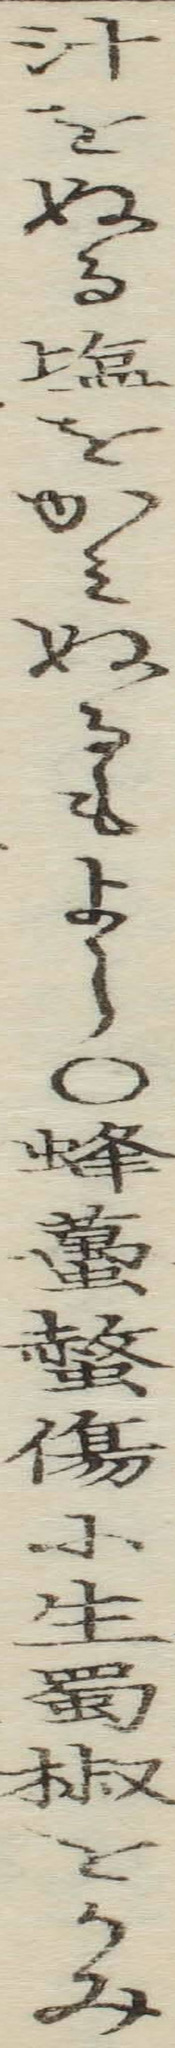汁をぬる塩をかみぬるもよし○蜂蠆螫傷に生蜀椒をかみ
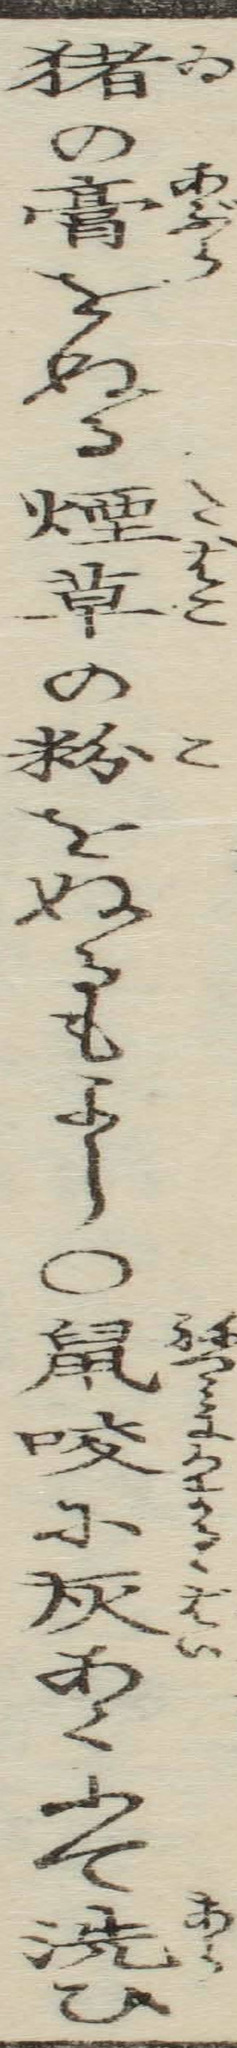猪の膏をぬる煙草の粉をぬるもよし○䑕咬に灰あくにて洗ひ

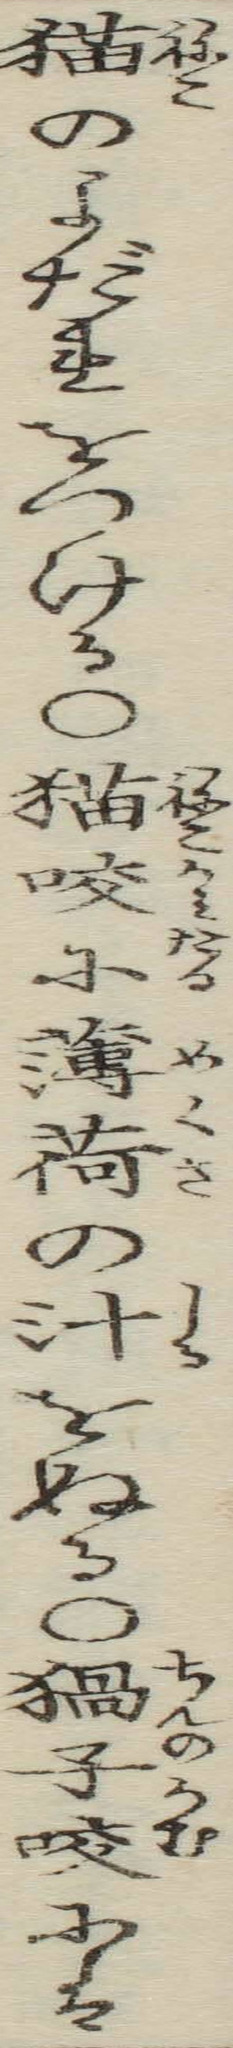猫のよだれをつける○猫咬に薄荷の汁をぬる○猧子咬には
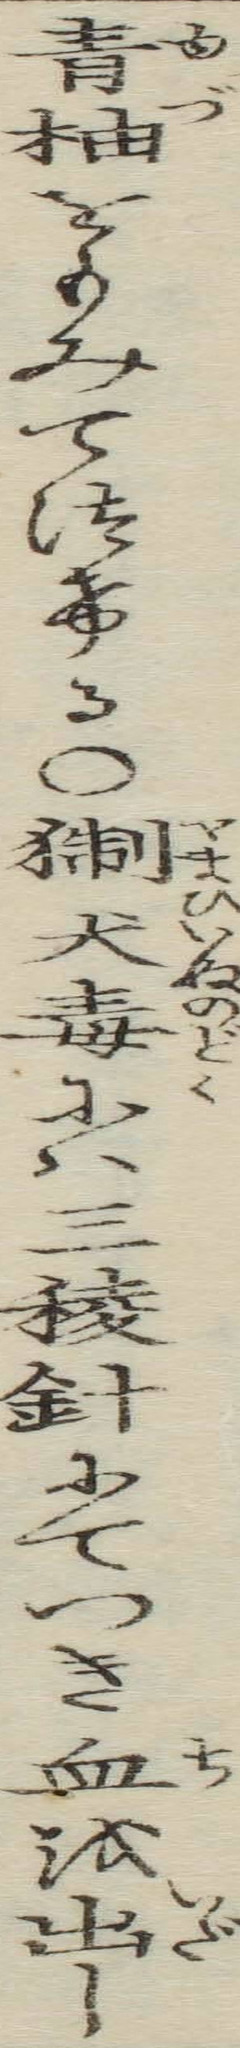青柚をもみてつける○猘犬毒には三稜針にてつき血を出し
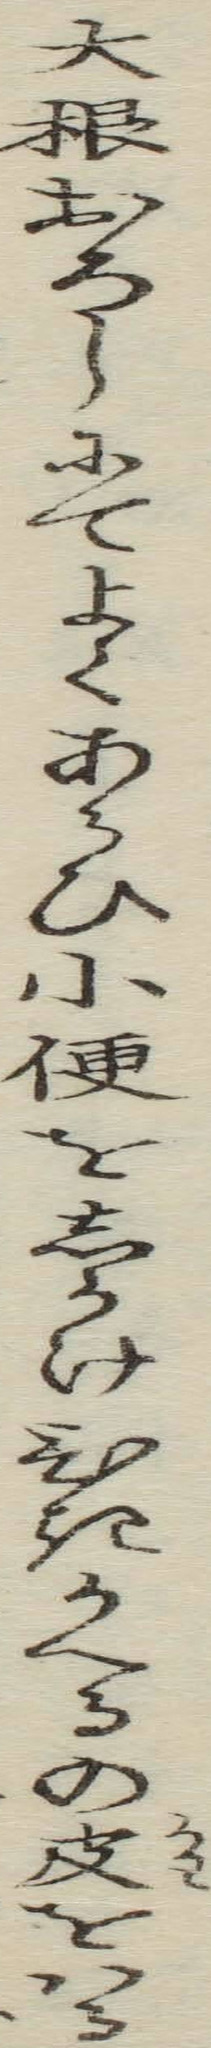大根おろしにてよくあらひ小便をしかけひきかへるの皮をはる
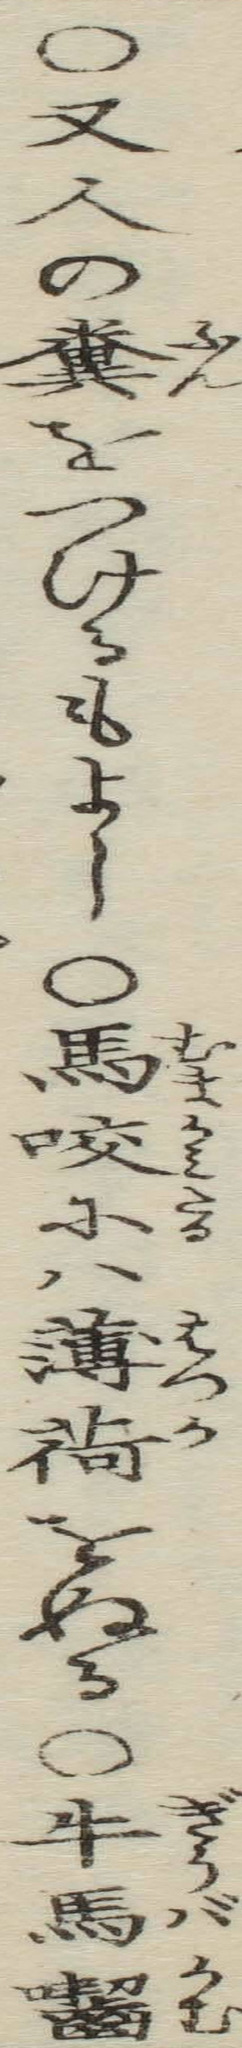○又人の糞をつけるもよし○馬咬には薄荷をぬる○牛馬囓
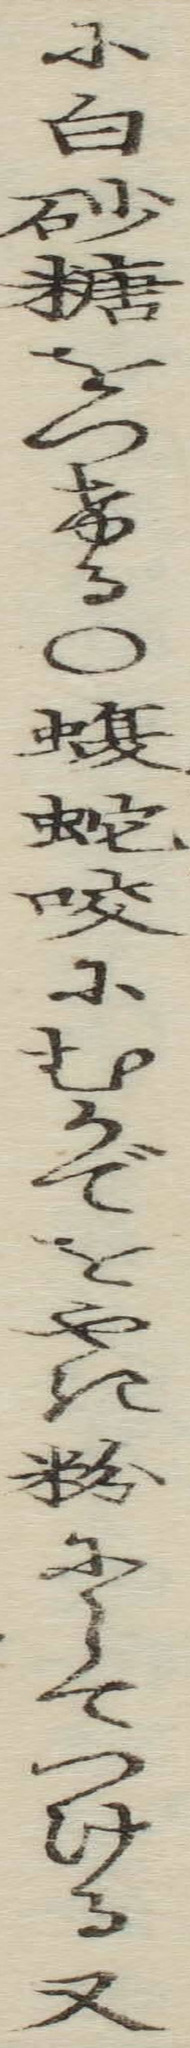に白砂糖をつける○蝮蛇咬にむかでをやき粉にしてつける又
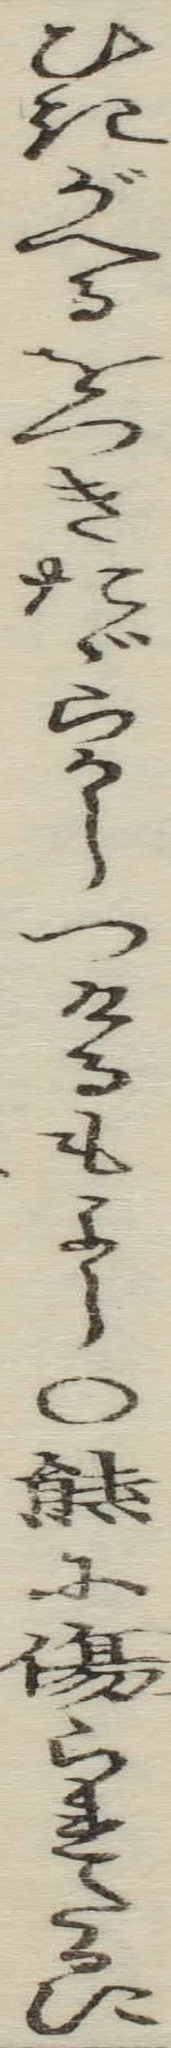ひきがへるをつきたゞらかしつけるもよし○熊に傷られたるに
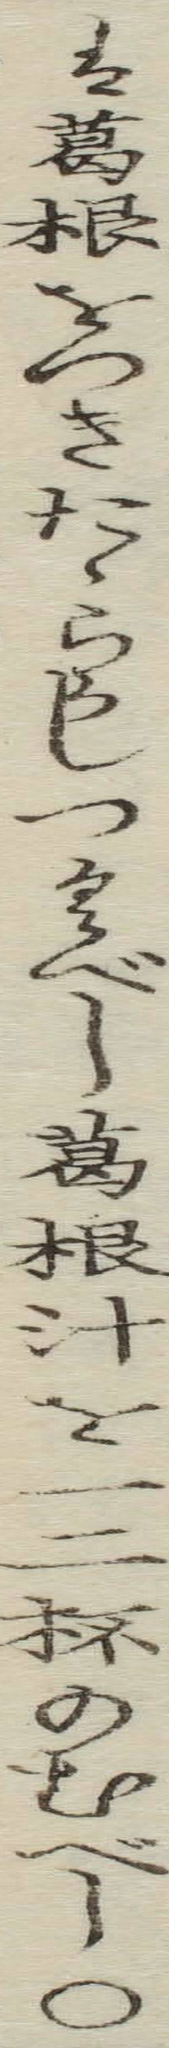は葛根をつきたゝらかしつくべし葛根汁を一二杯のむべし○
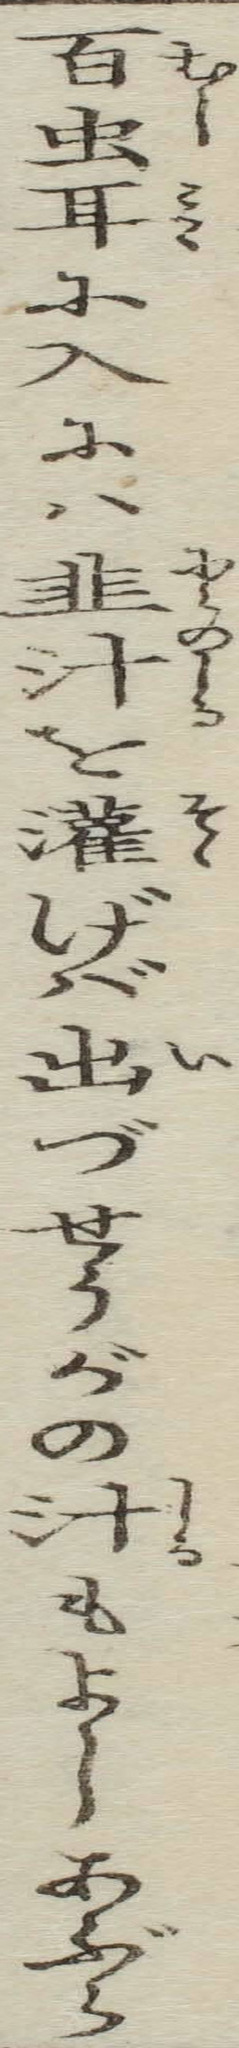百虫耳に入には韭汁を灌げば出づせうがの汁もよしあぶら
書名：救荒便覧
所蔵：国文学研究資料館
